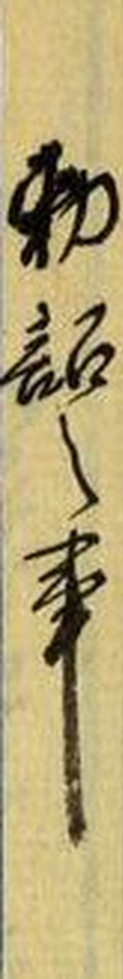勅詔之事
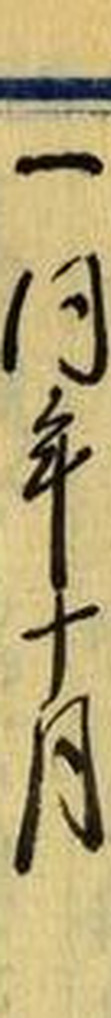一同年十月
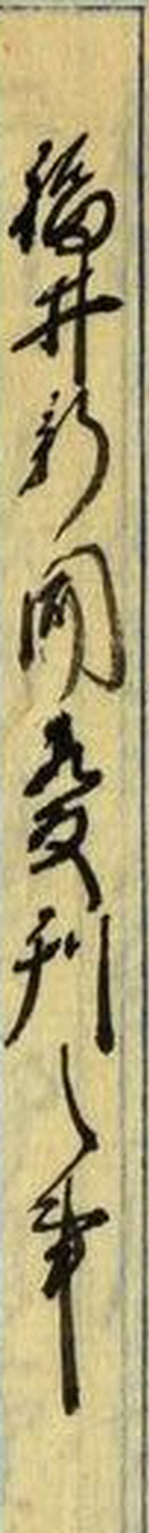福井新聞発刊之事

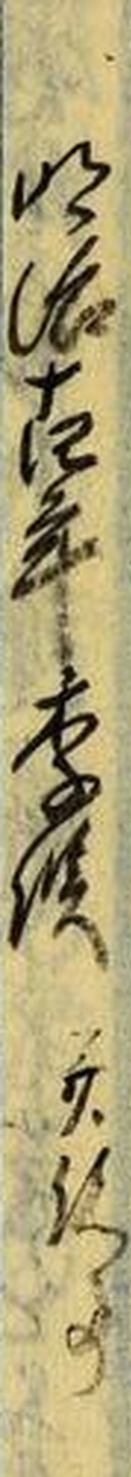明治十四年季候并諸事
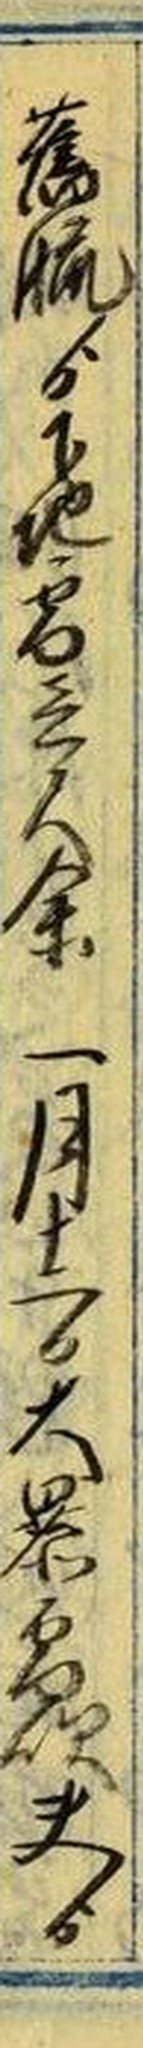舊臘ゟ下地雪壱尺余一月十二日大暴雪様夫ゟ
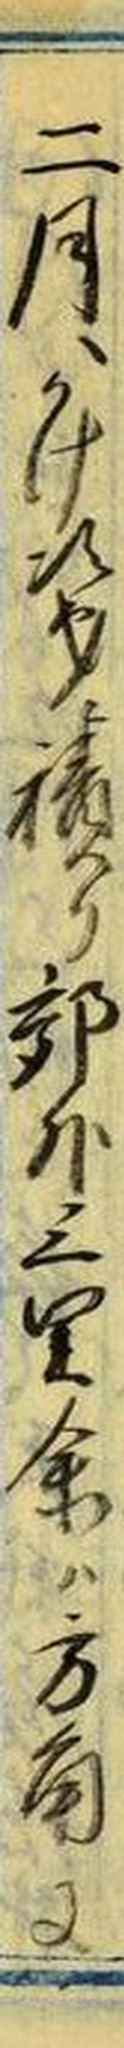二月へかけ次第に積り郊外三里余は方角に
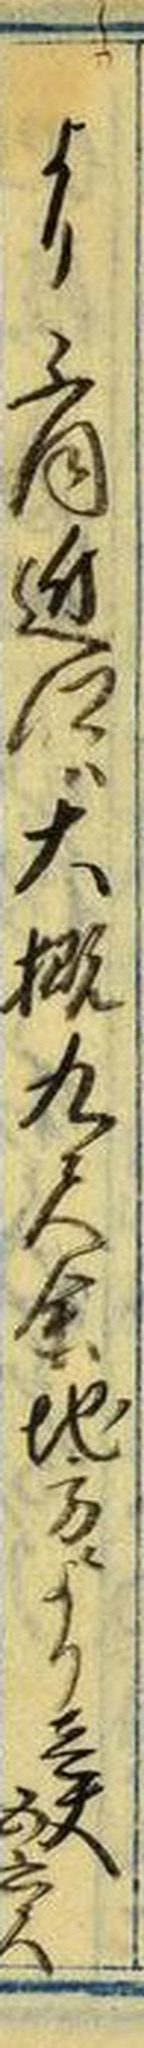より不同近郷は大概九尺余地方により一丈五六尺
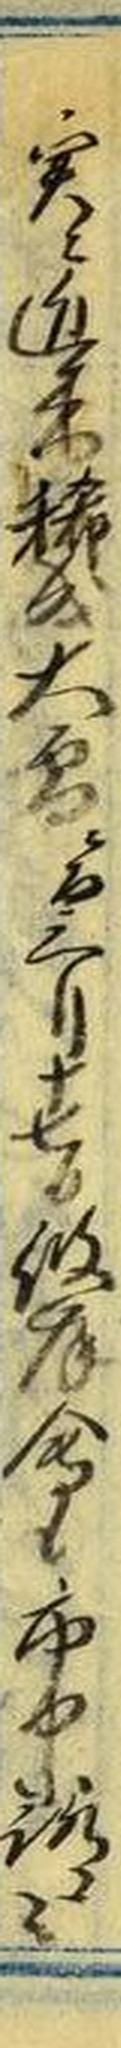実に近来稀成大雪に而三月十七日彼岸会も市中小路にて
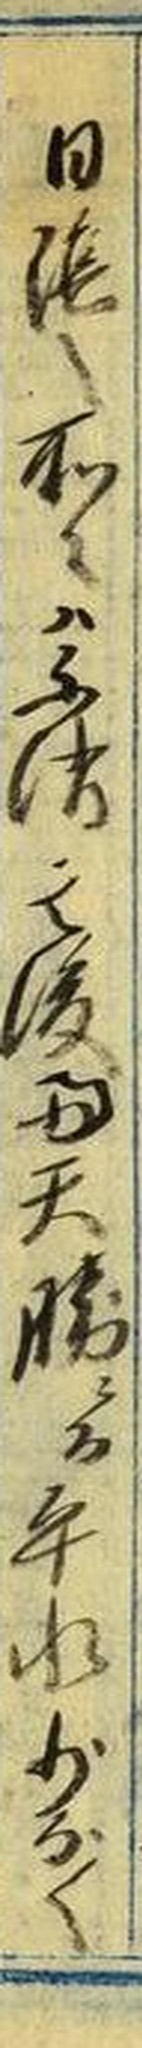日陰之所々は不消其後雨天勝に而平水少なく
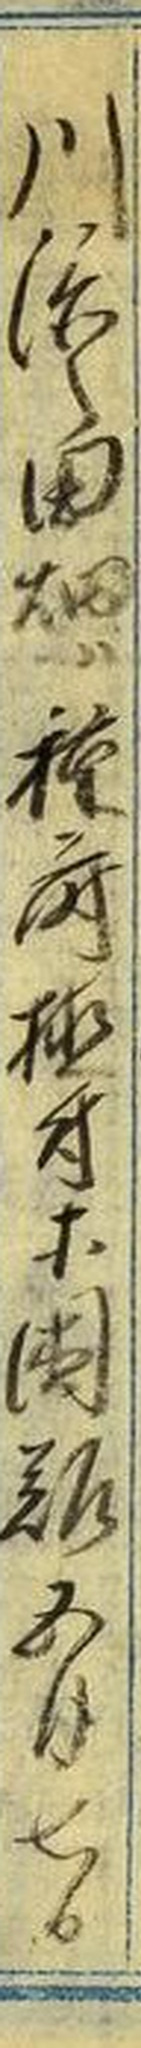川添之田畑は種蒔植付等困難五月七日
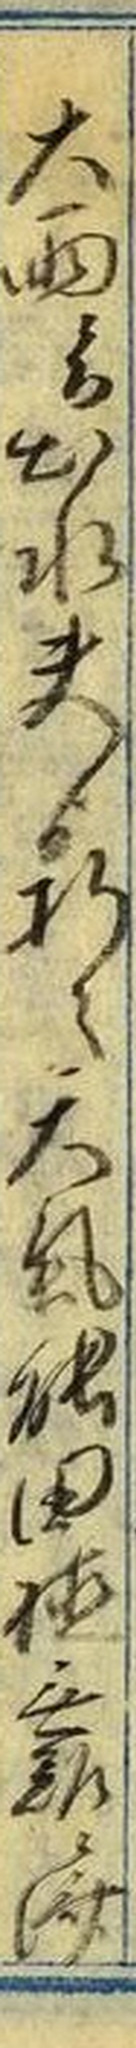大雨に而出水夫ゟ折々天気能田植無難に済
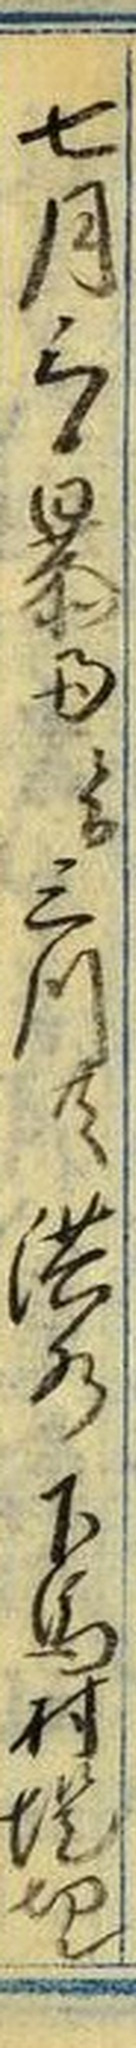七月三日暴雨に而三川共洪水下馬村堤切れ
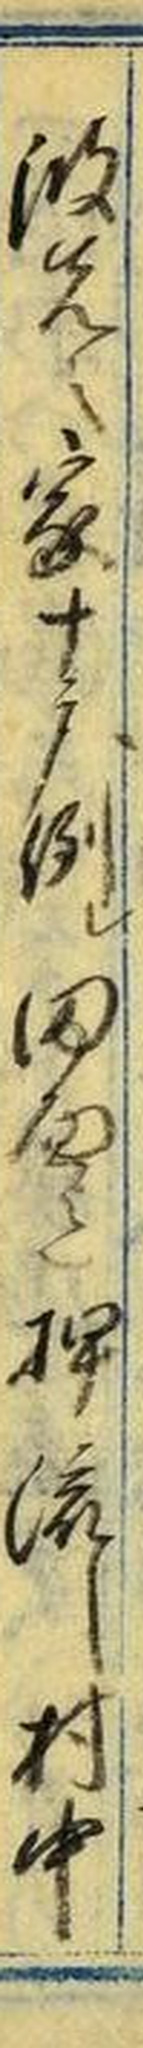彼先之家十戸倒れ田面迄押流し村中

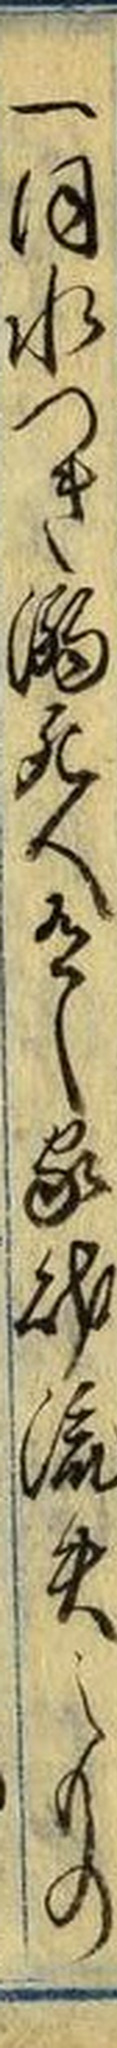一同水つき溺死人有之家財流失之もの
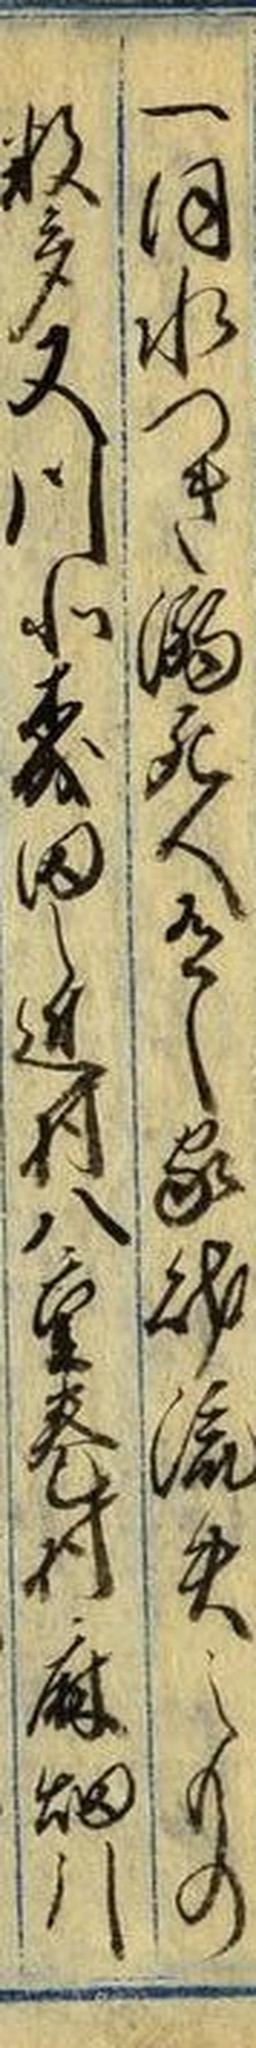数多又川北森田之近村八重巻村麻畑引
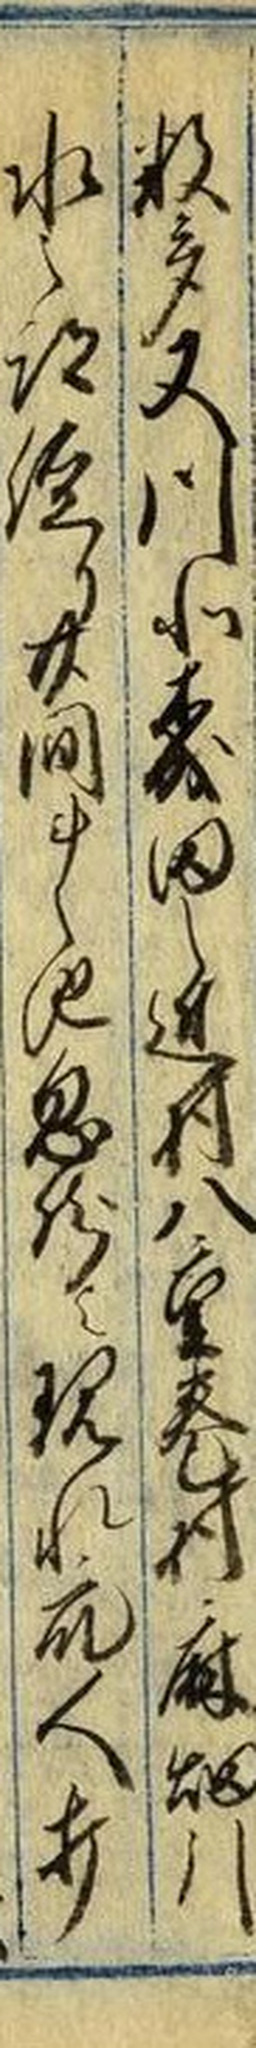水之跡径り廿間計之池忽然と現れ衆人打
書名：温古集 五巻
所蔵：福井県文書館 Fukui Prefectural Archives
